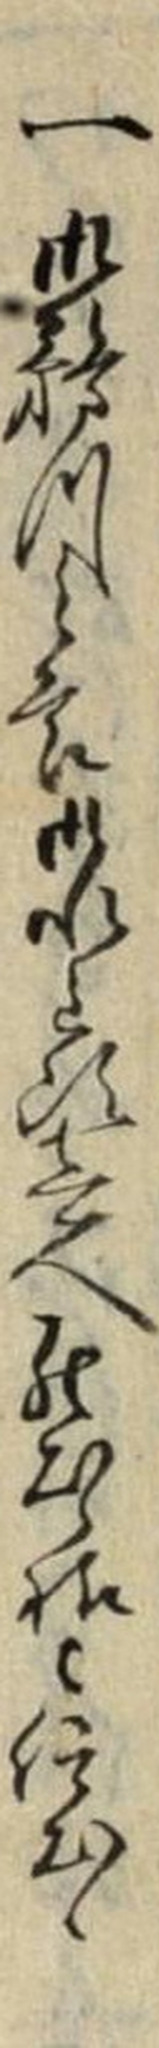一御鵜川之節御水主頭壱人罷出候様被仰出候
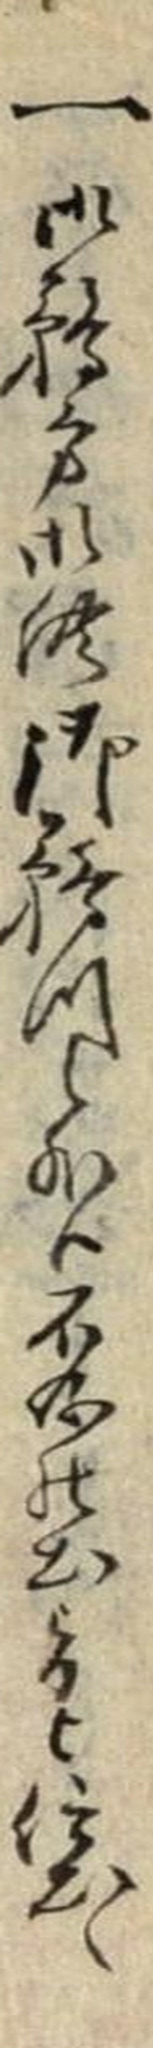一御鵜方御供御鵜川之外は不及罷出旨被仰出候
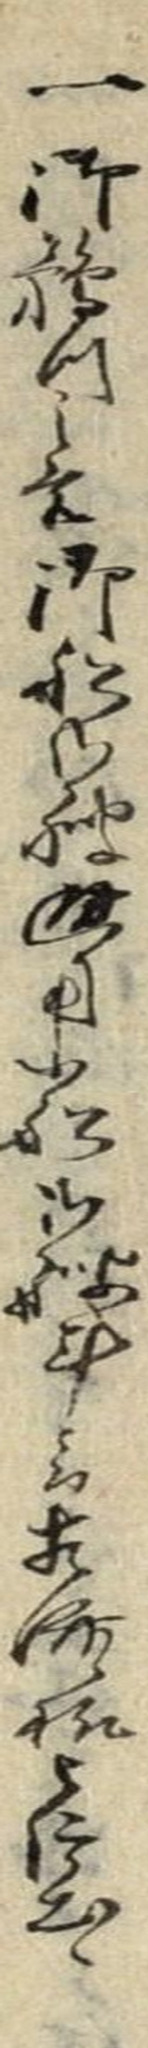一御鵜川之節御船弐艘通用小船弐艘斗に而相済候様被仰出候
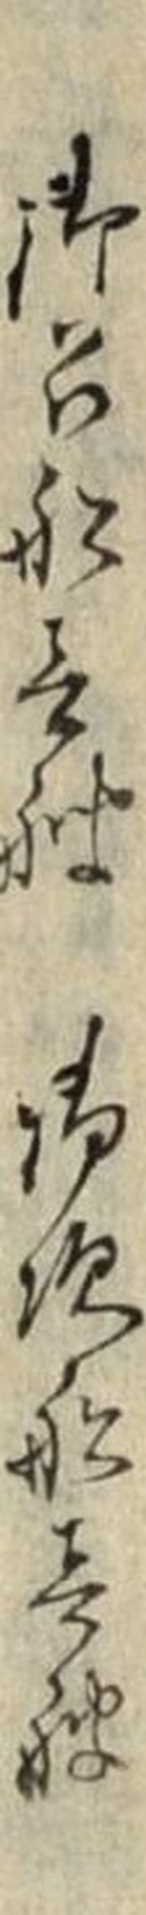御召船壱艘御次船壱艘
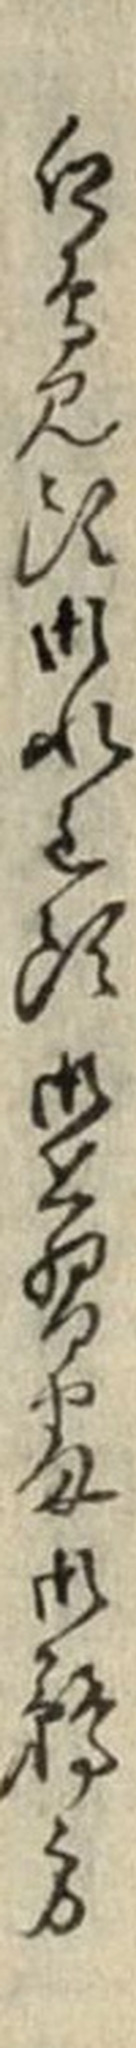但鳥見頭御水主頭御近習番御鵜方
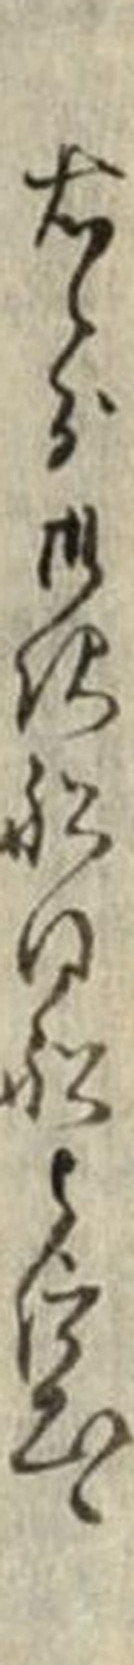右之分御次船同船被仰出候
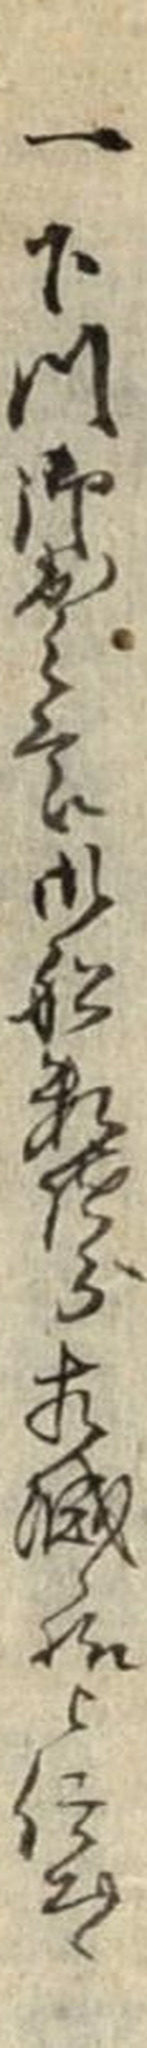一下川御出候節御船類随分相減候様被仰出候
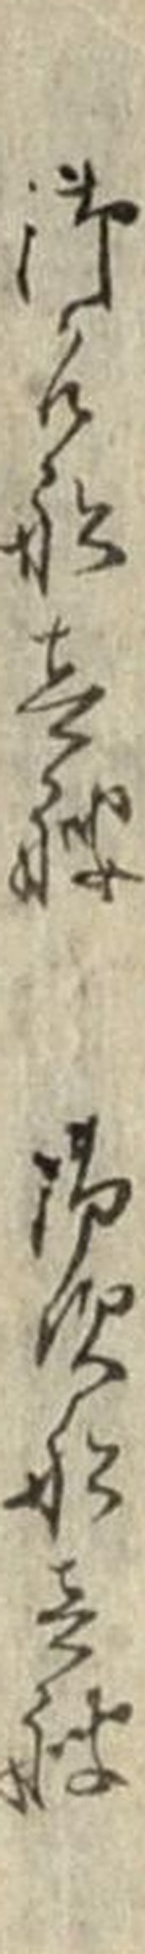御召船壱艘御次船壱艘
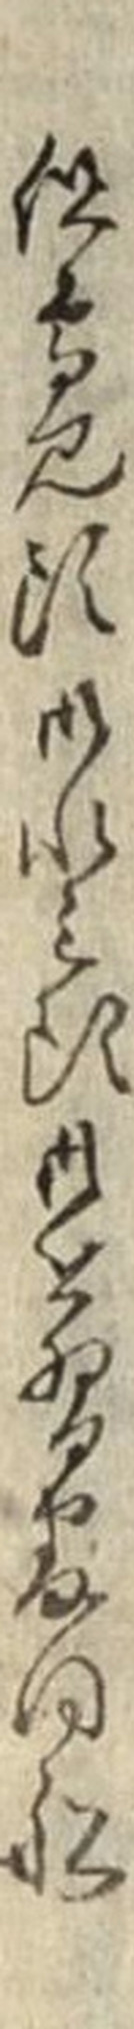但鳥見頭御水主頭御近習番同船
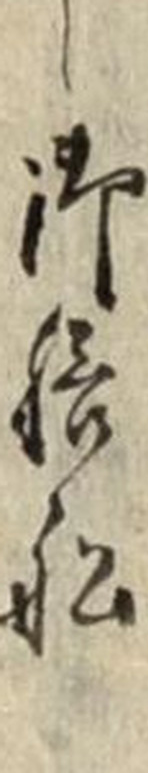御膳船
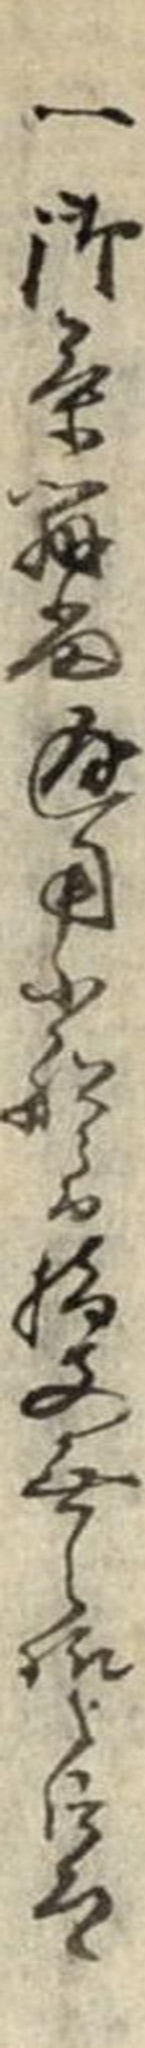一御茶弁当通用小船に而指支無之様被仰出候
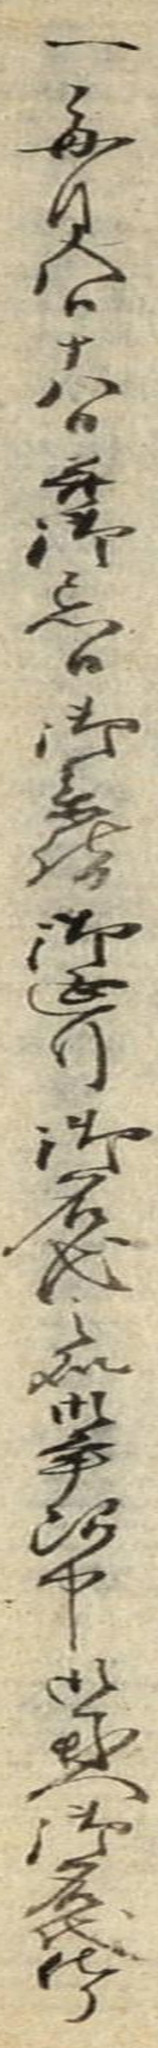一毎月八日十八日并御忌日御参詣御延引御名代之処御年限中御用人御名代代り
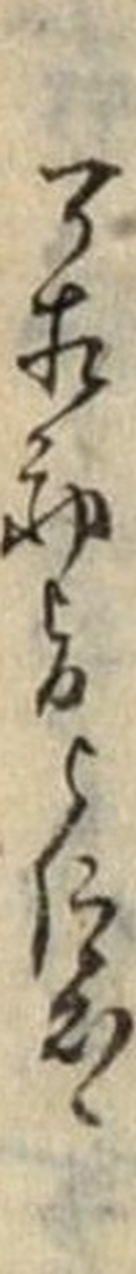可相勤旨被仰出候

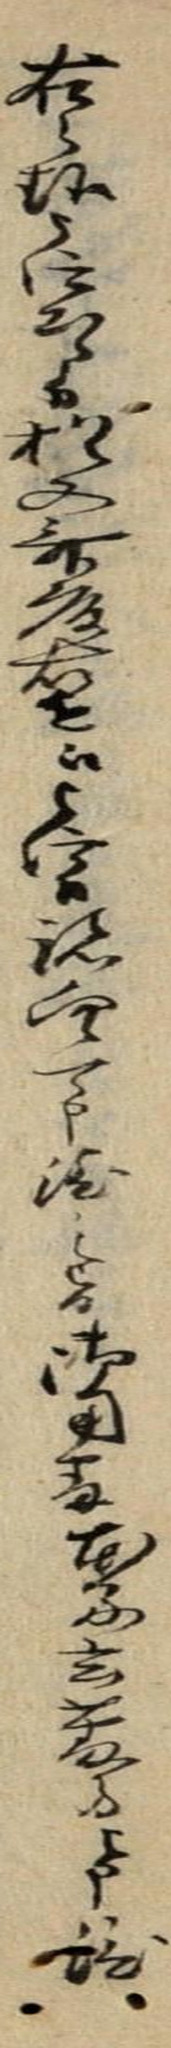右之趣被仰出候に付猶又斉藤右近江被仰付諸向可申渡之旨御用番本多玄蕃方申渡候
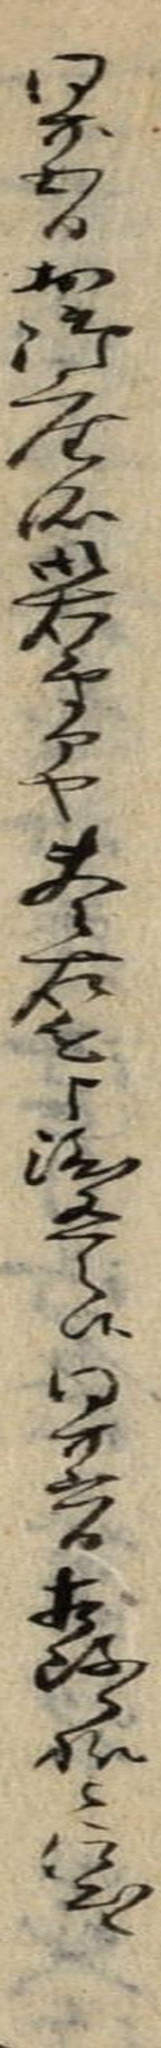同廿五日於御座所御右筆部や夫々右近申渡有之候同廿六日相改候様被仰出候
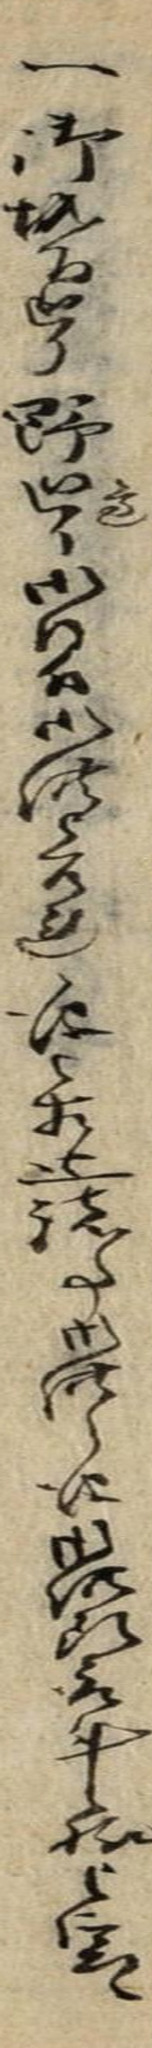一御城下廻り野辺廻り御目付御供被召連候儀被相止諸事御供之儀御供頭取斗候様被仰出候
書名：御用并被仰出之部
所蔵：福井県文書館 Fukui Prefectural Archives
